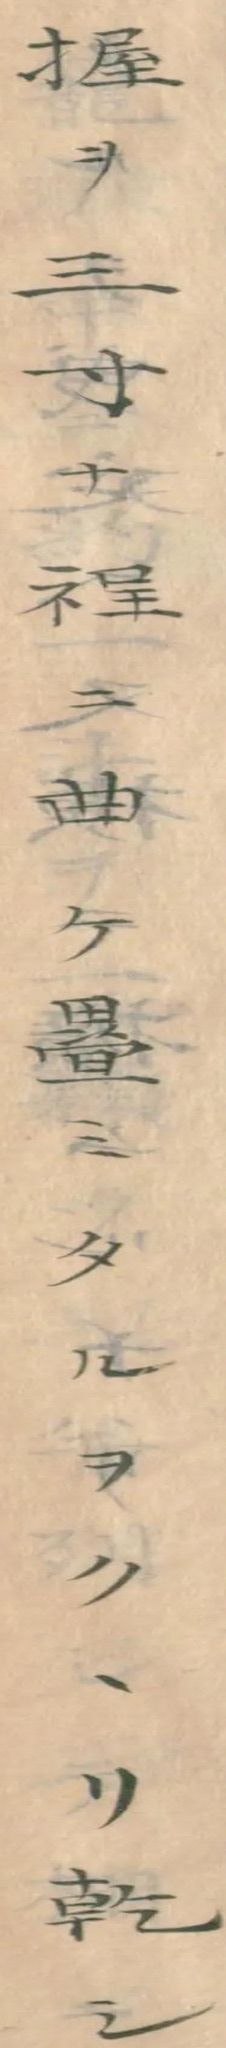握ヲ三寸ナ程ニ曲ケ畳ミタルヲクヽリ乾シ

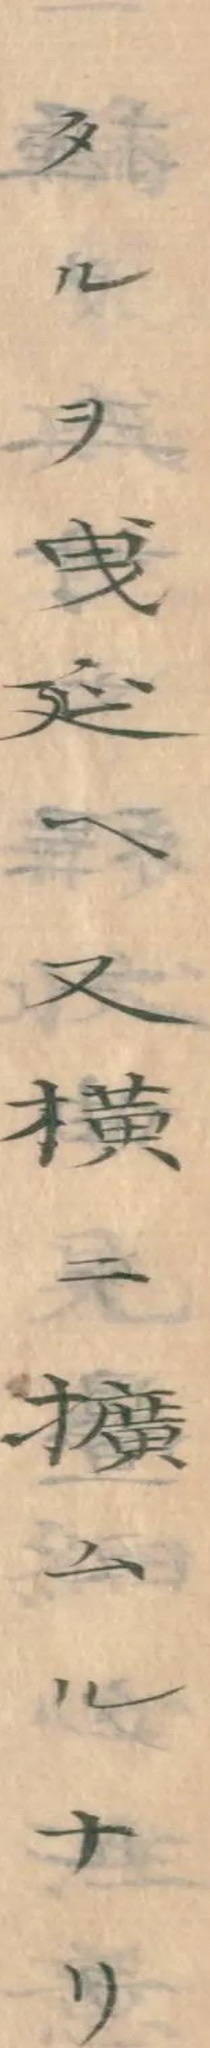タルヲ曳延ヘ又横ニ拡ムルナリ
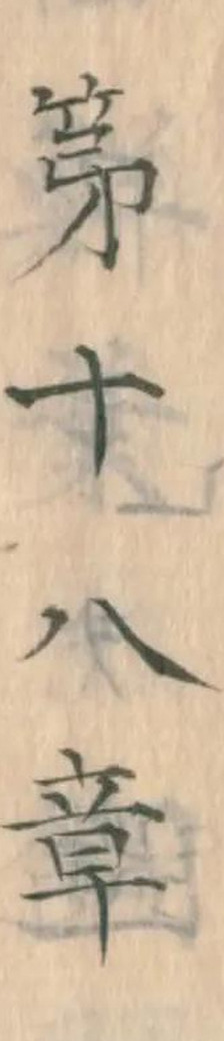第十八章
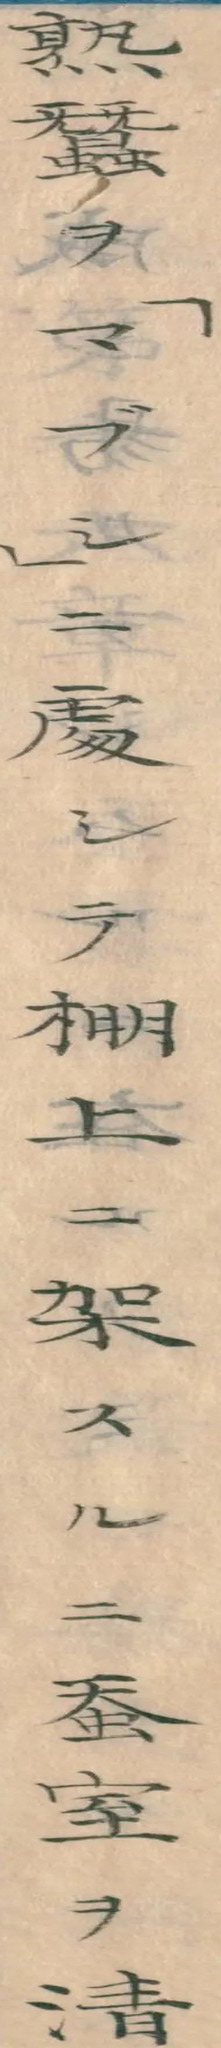熟蚕ヲ「マブシ」ニ処シテ棚上ニ架スルニ蚕室ヲ清
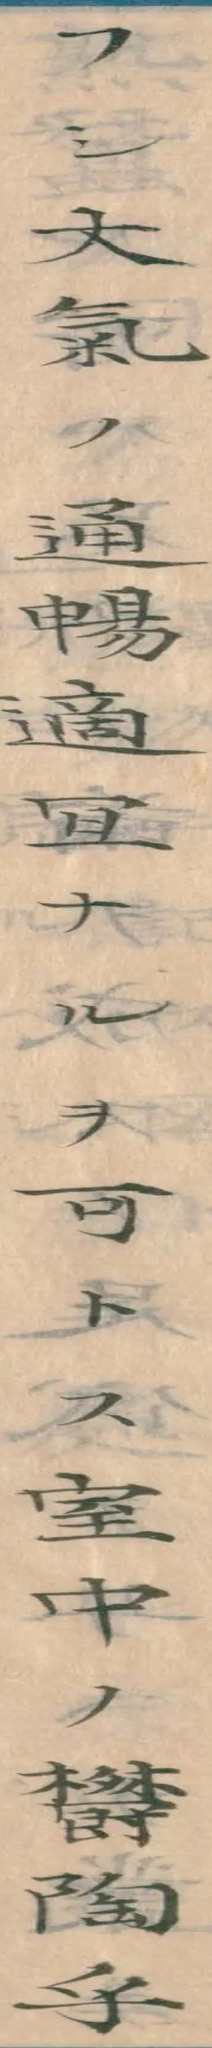フシ大気ノ通暢適宜ナルヲ可トス室中ノ鬱陶乎
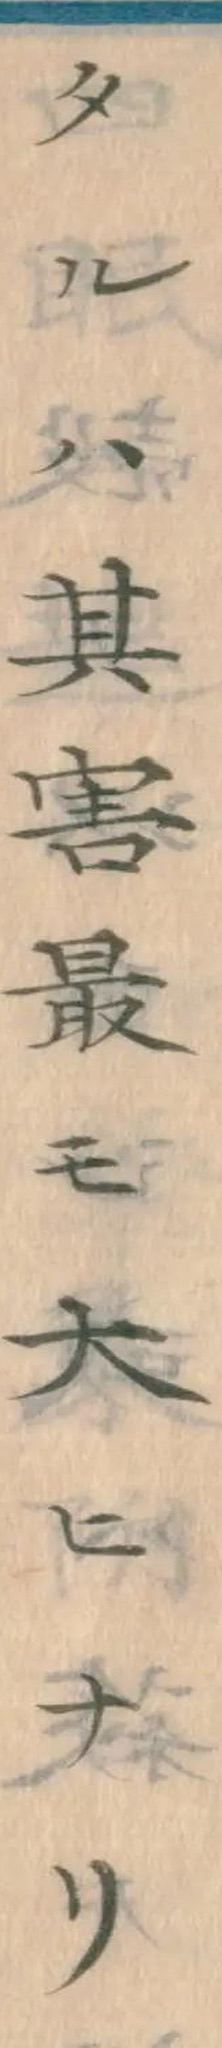タルハ其害最モ大ヒナリ
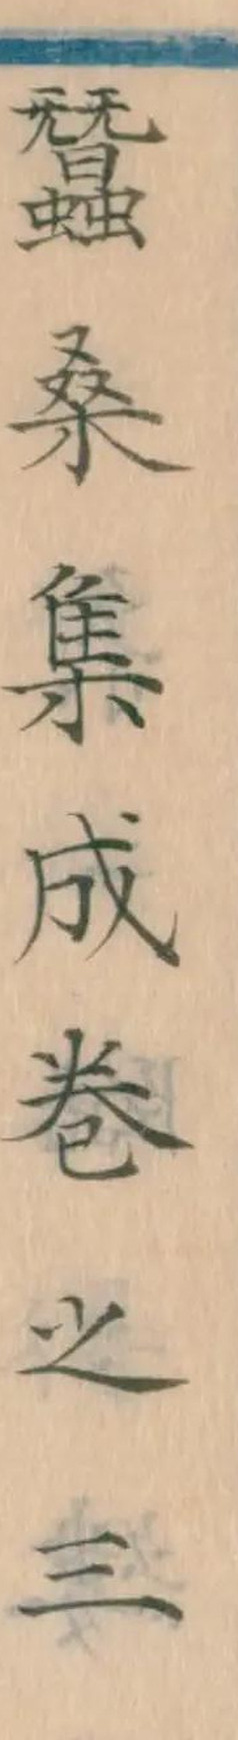蚕桑集成巻之三
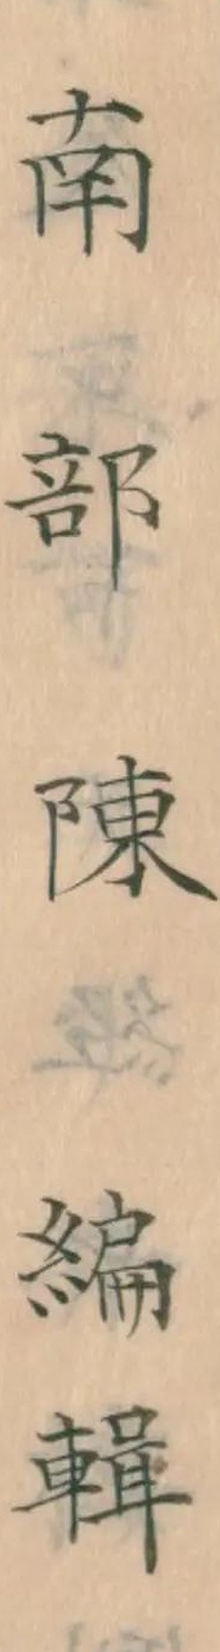南部陳編輯
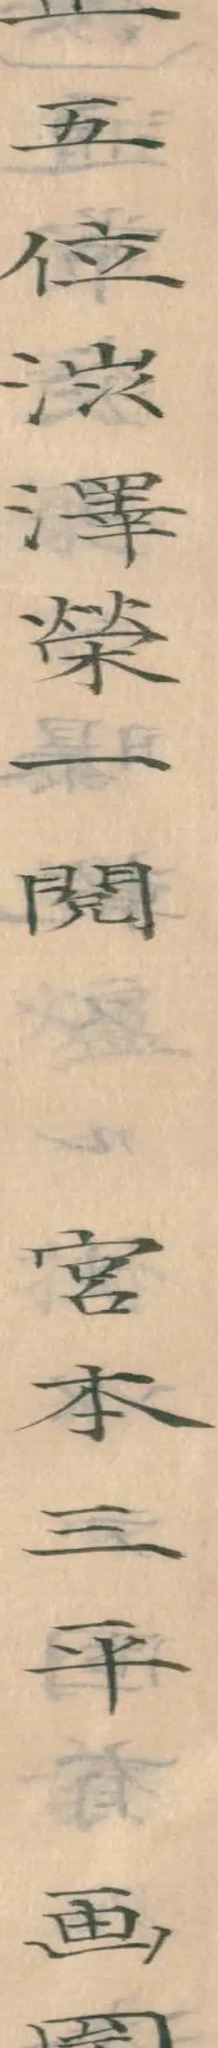正五位渋沢栄一閲宮本三平画図
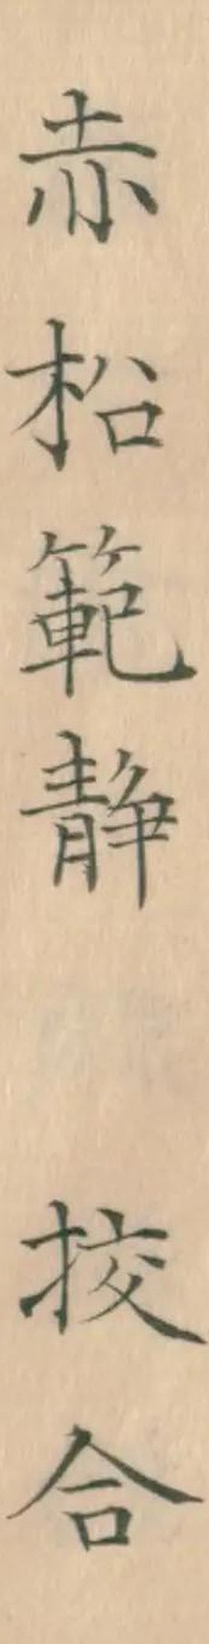赤柗範静挍合
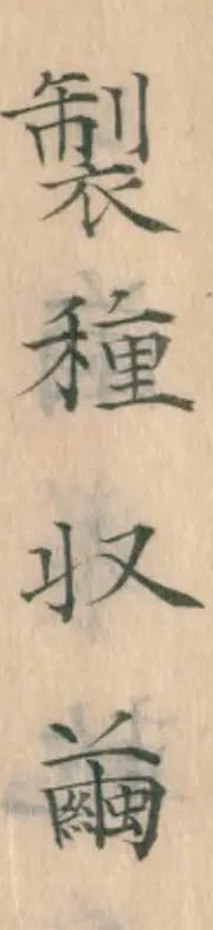製種収繭
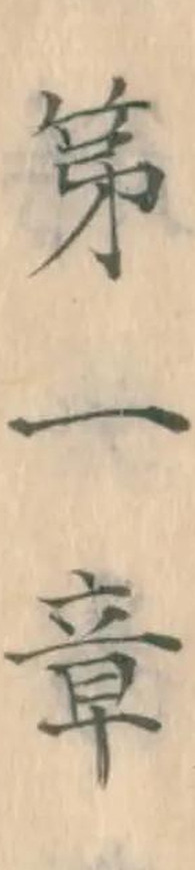第一章
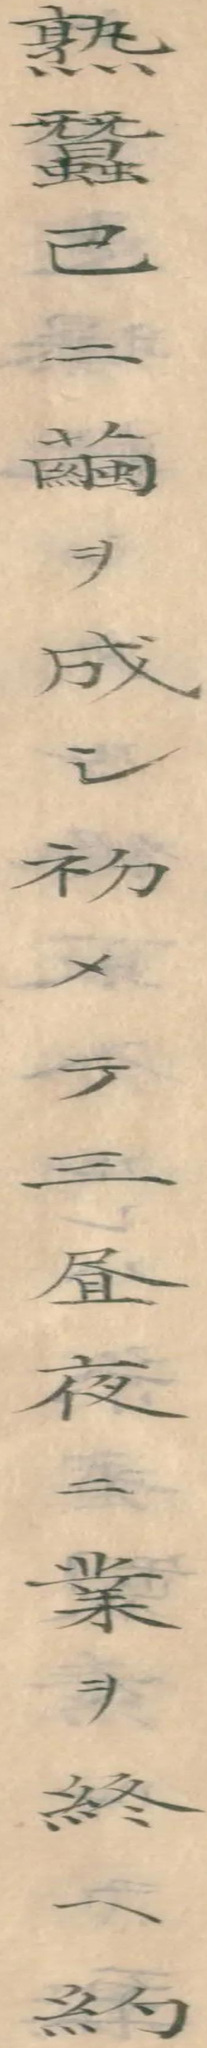熟蚕已ニ繭ヲ成シ初メテ三昼夜ニ業ヲ終ヘ約
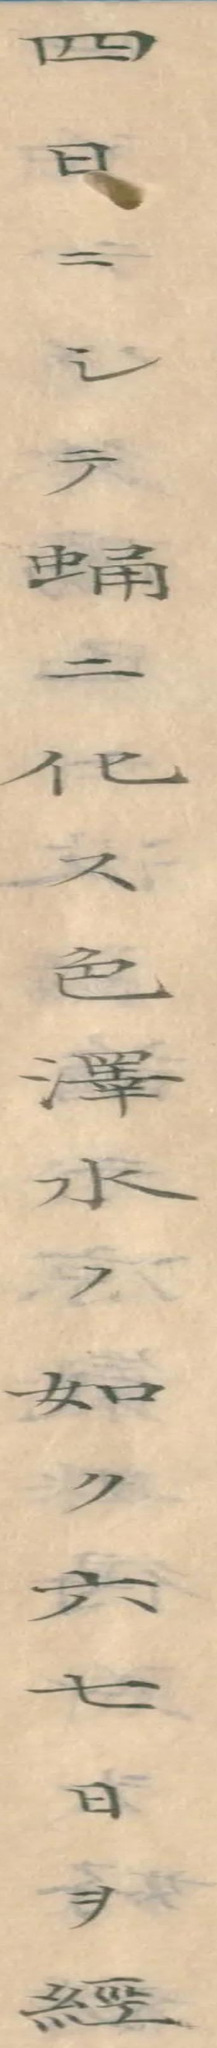四日ニシテ蛹ニ化ス色沢水ノ如ク六七日ヲ経
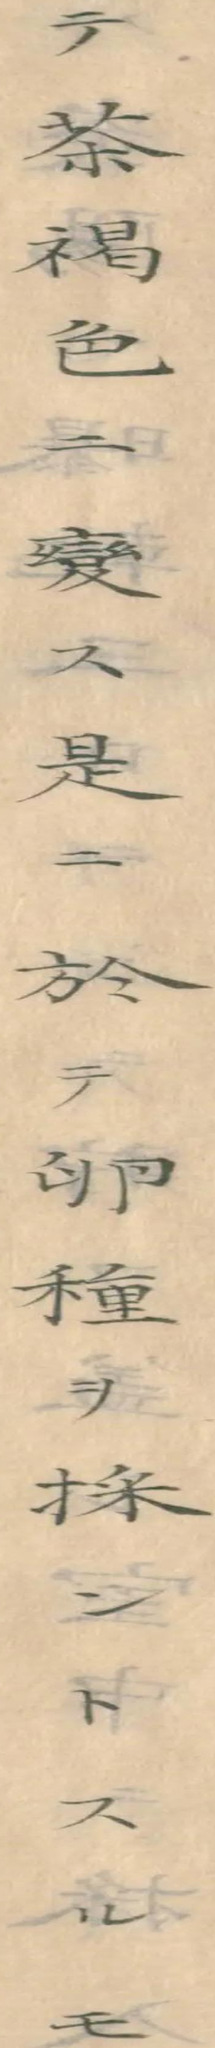テ茶褐色ニ変ス是ニ於テ卵種ヲ採ントスルモ
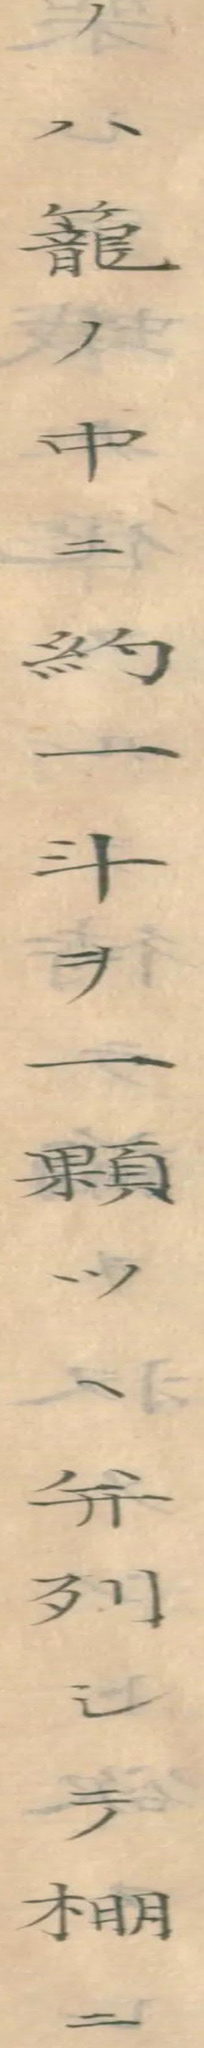ノハ籠ノ中ニ約一斗ヲ一顆ツヽ弁列シテ棚ニ
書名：蚕桑集成
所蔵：国立国会図書館 National Diet Library, JAPAN
